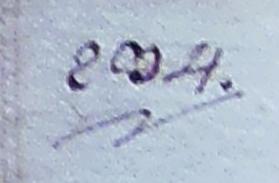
234.
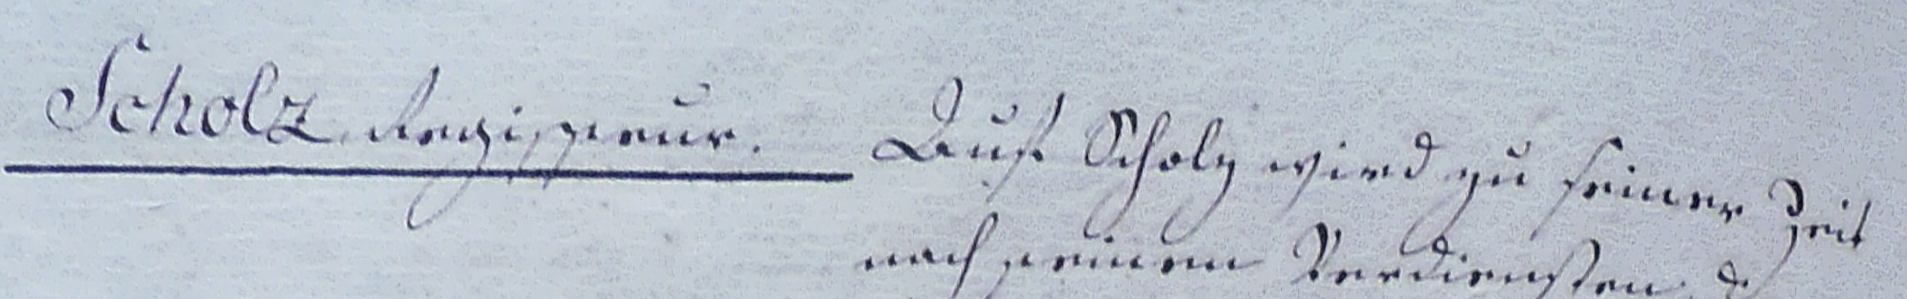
Scholz, Regisseur. Auf Scholz wird zu seiner Zeit
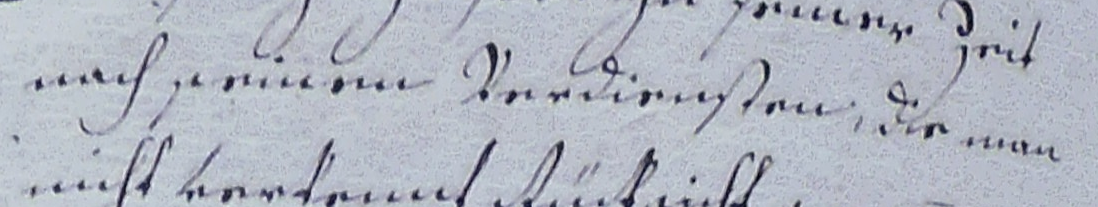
nach seinen Verdiensten, die man
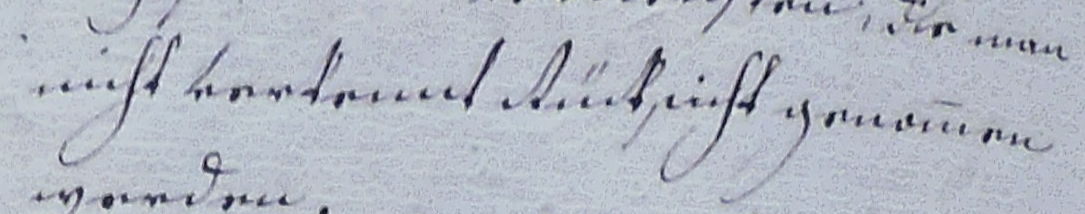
nicht verkennt Rücksicht genom̅en
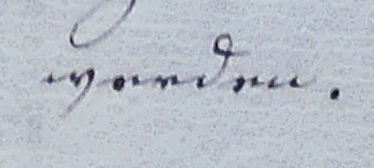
werden.
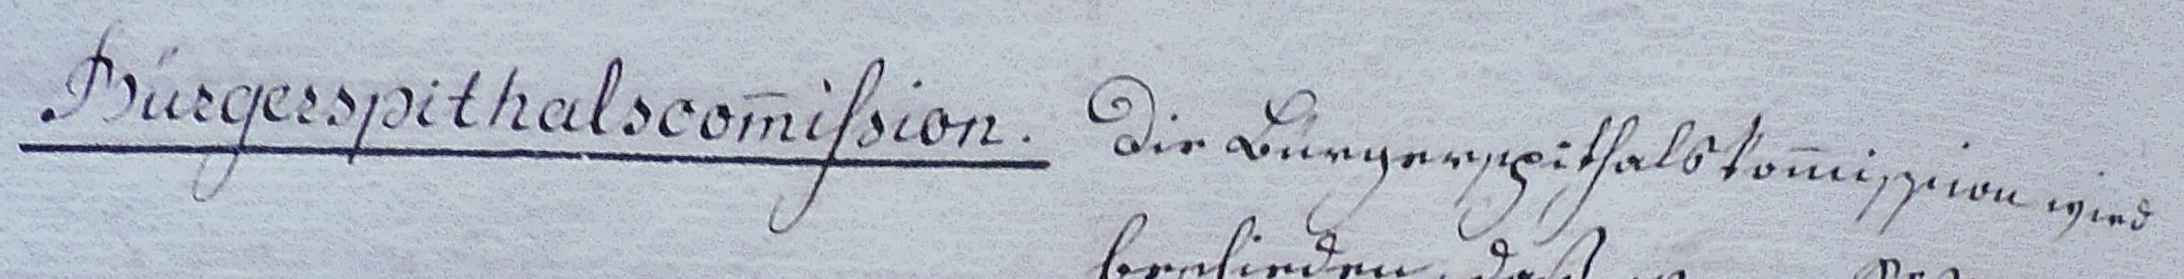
Bürgerspithalscom̅ission. Die Bürgerspithalskom̅ission wird
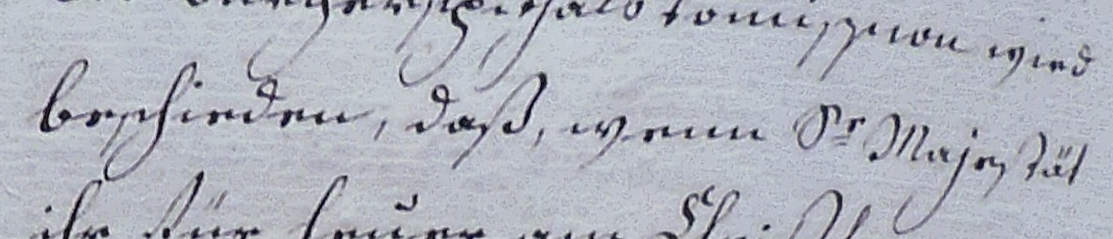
beschieden, daß, wenn Se͇ Majestät
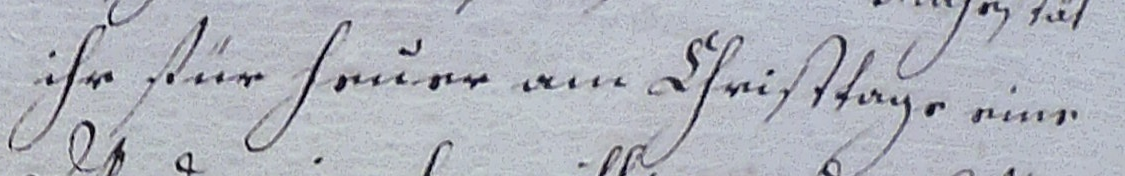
ihr für heuer am Christtage eine
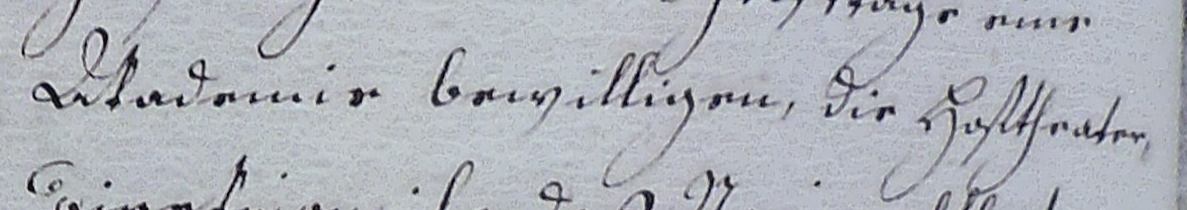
Akademie bewilligen, die Hoftheater
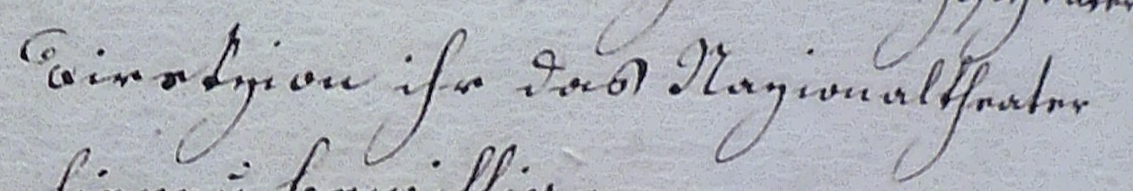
Direkzion ihr das Nazionaltheater
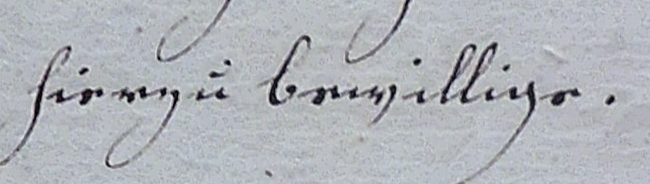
hierzu bewillige.
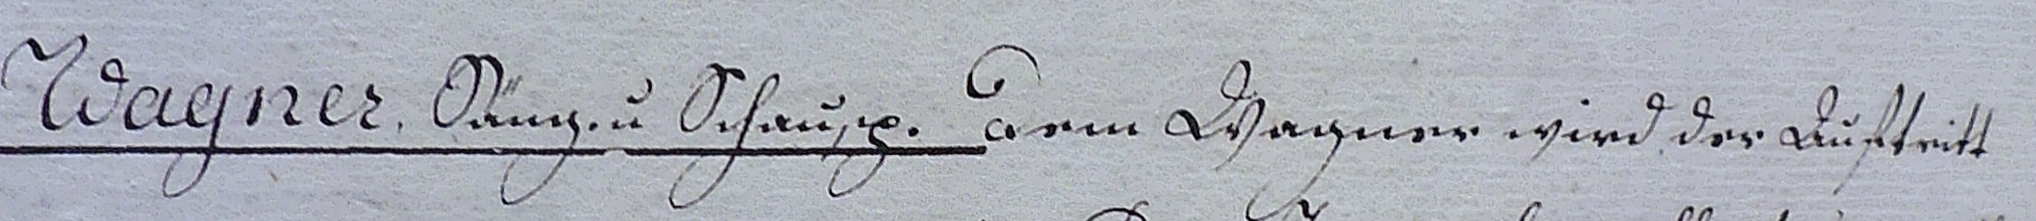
Wagner, Säng. u Schausp. Dem Wagner wird der Auftritt
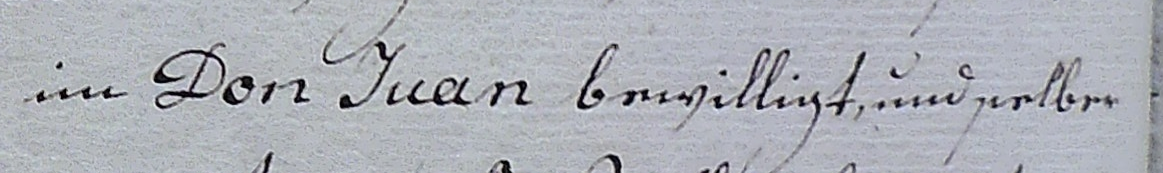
im Don Juan bewilligt, und selber
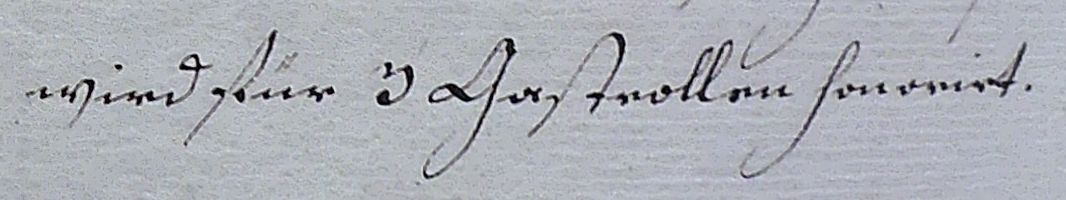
wird für 3 Gastrollen honorirt.
